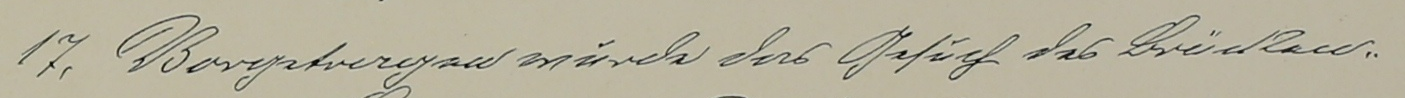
17. Vorgetragen wurde das Gesuch des Brücken-
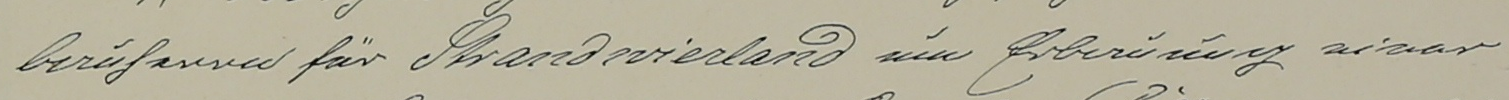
bauherrn für Strandwierland um Erbauung einer
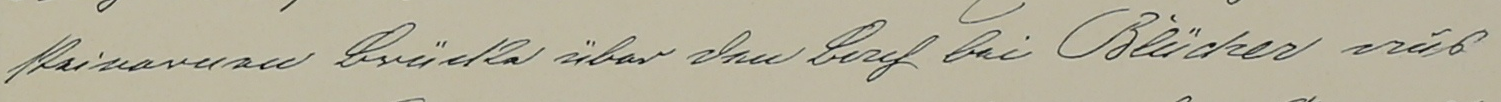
steinernen Brücke über den Bach bei Blücher aus
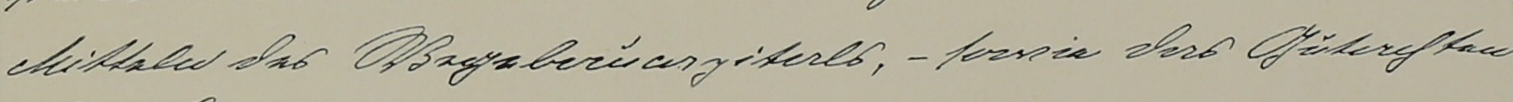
Mitteln des Wegebaukapitals, - sowie das Gutachten
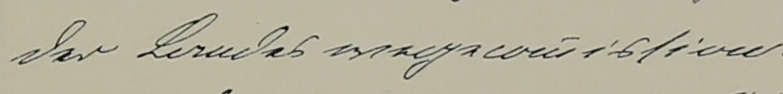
der Landeswegecommission.
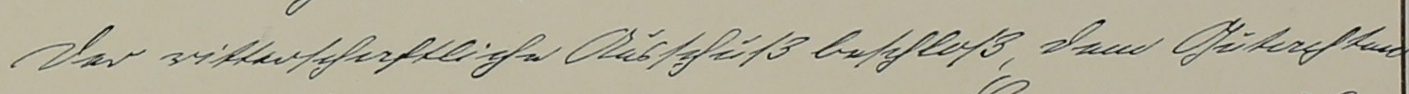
Der ritterschaftliche Ausschuß beschloß, dem Gutachten
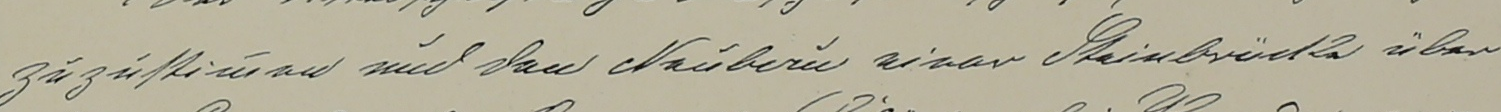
zuzustimmen und den Neubau einer Steinbrücke über
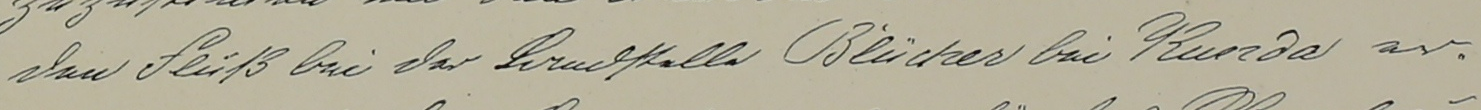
den Fluß bei der Landstelle Blücher bei Kunda er-
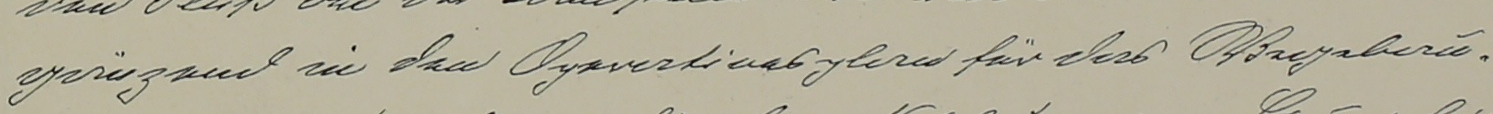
gänzend in den Operationsplan für das Wegebau-
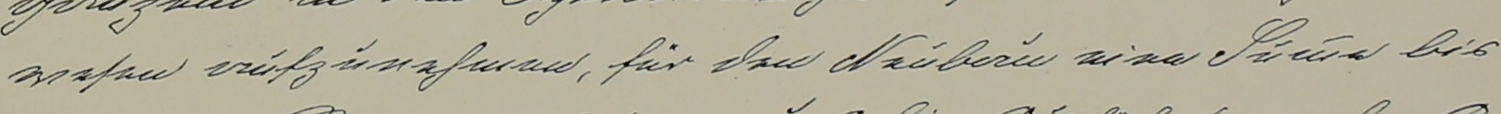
wesen aufzunehmen, für den Neubau eine Summe bis
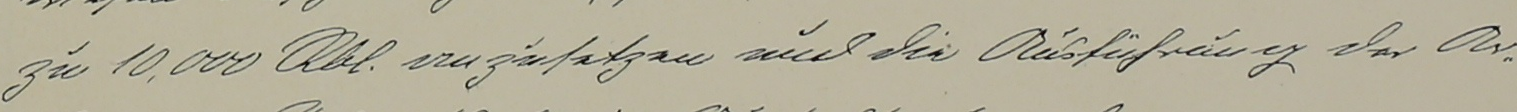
zu 10.000 Rbl. anzusetzen und die Ausführung der Ar-
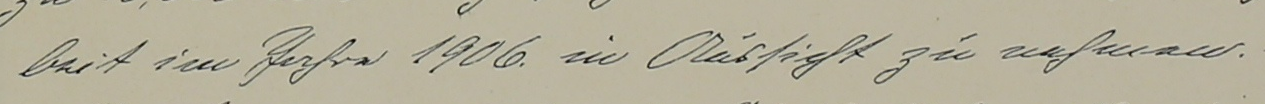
beit im Jahre 1906. in Aussicht zu nehmen.
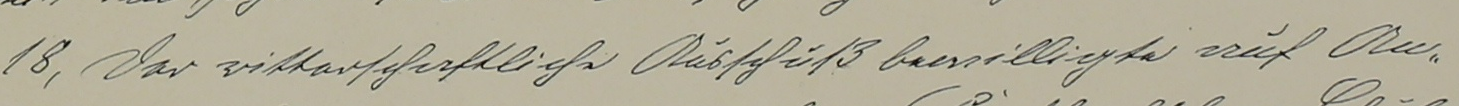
18. Der ritterschaftliche Ausschuß bewilligte auf An-
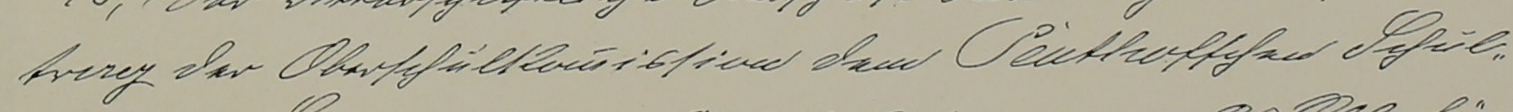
trag der Oberschulkommission dem Peuthofschen Schul-
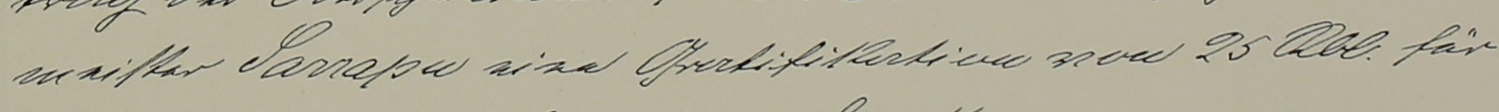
meister Sarrapu eine Gratifikation von 25 Rbl. für
